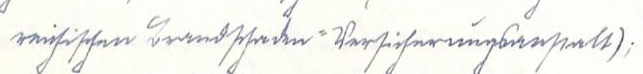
reichischen Brandschaden - Versicherungsanstalt);
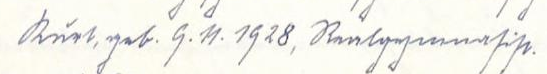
Kurt, geb. 9. 11. 1928, Paulgymnasist.
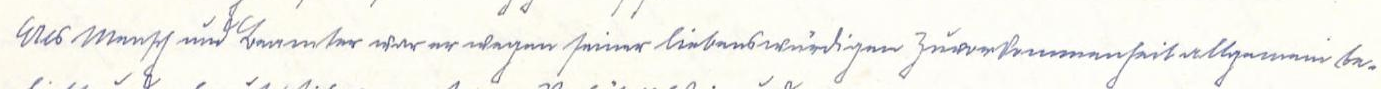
Als Mensch und Beamter war er wegen seiner liebenswürdigen Zuvorkommenheit allgemein be-
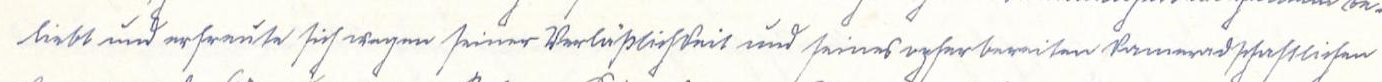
liebt und erfreute sich wegen seiner Verläßlichkeit und seines opferbereiten, kameradschaftlichen
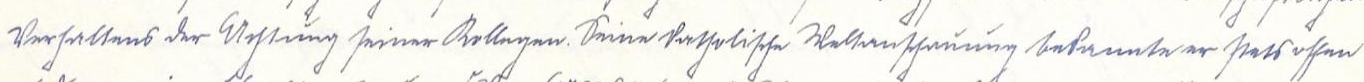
Verhaltens der Achtung seiner Kollegen. Seine katholische Weltanschauung bekannte er stets offen
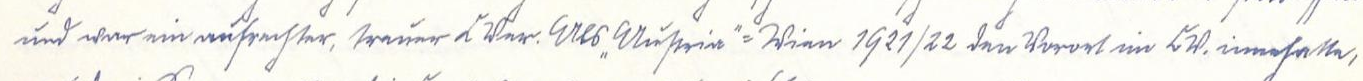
und war ein aufrechter, treuer CVer. Als „Austria" – Wien 1921/22 den Vorort im CV innehatte,
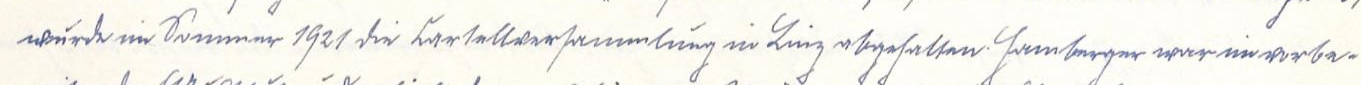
wurde im Sommer 1921 die Kartellversammlung in Linz abgehalten. Hamberger war im vorbe-
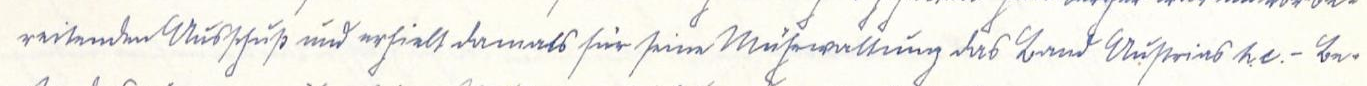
reitenden Ausschuss und erhielt damals für seine Mühewaltung das Band Austries h.c. - Be-
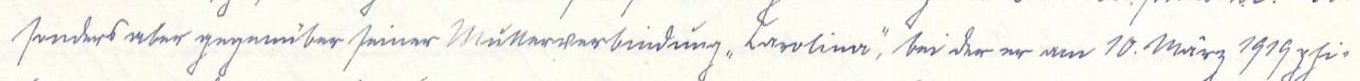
sonders aber gegenüber seiner Mutterverbindung "Carolina", bei der er am 10. März 1919 phi-
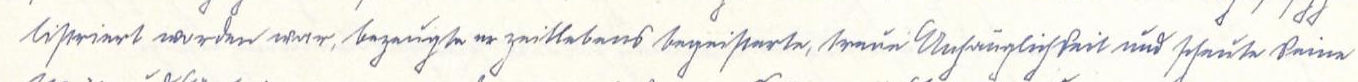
listriert worden war, bezeugte er zeitlebens begeisterte, treue Anhänglichkeit und scheute keine
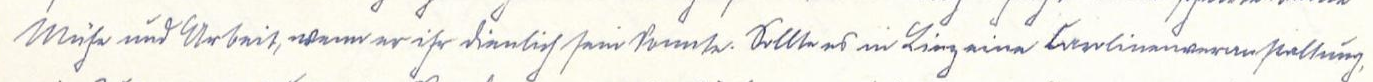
Mühe und Arbeit, wenn er ihr dienlich sein konnte. Sollte es in Linz einen Carolinenveranstaltung,
